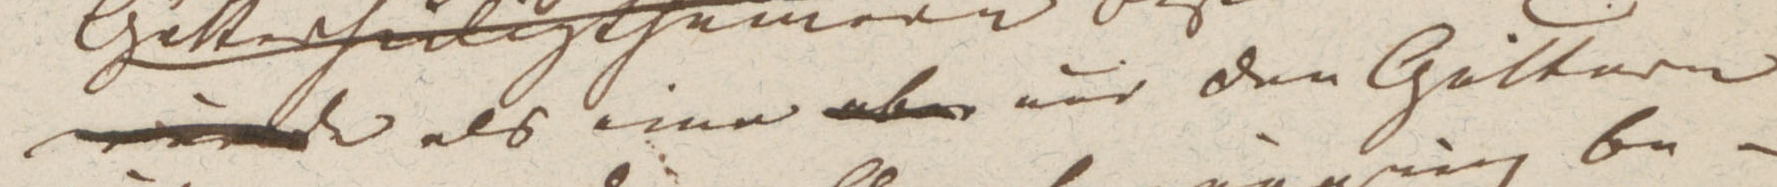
wurde als eine nur den Göttern
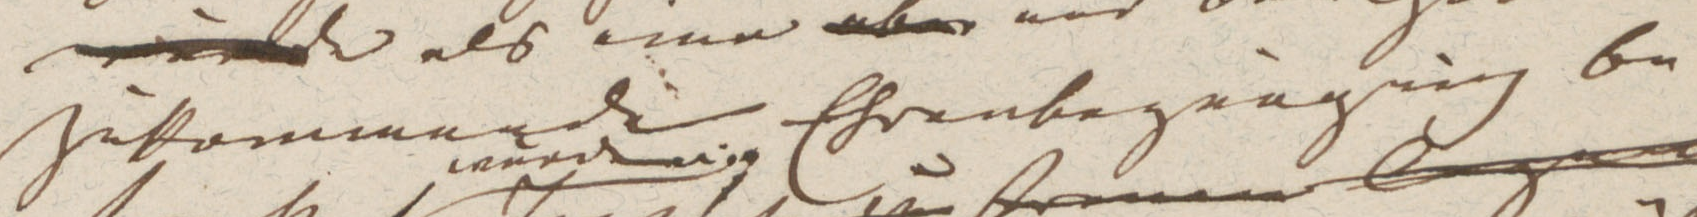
zukommende Ehrenbezeugung be-
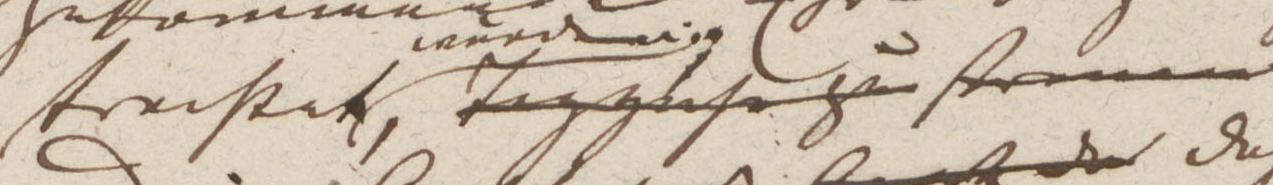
trachtet wurden, Teppiche zu legen,
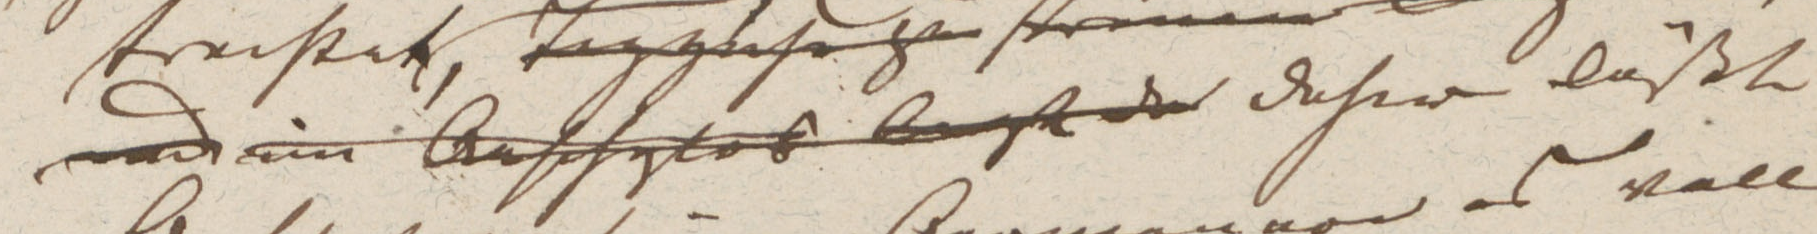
und im Aeschylos legt da daher lässt
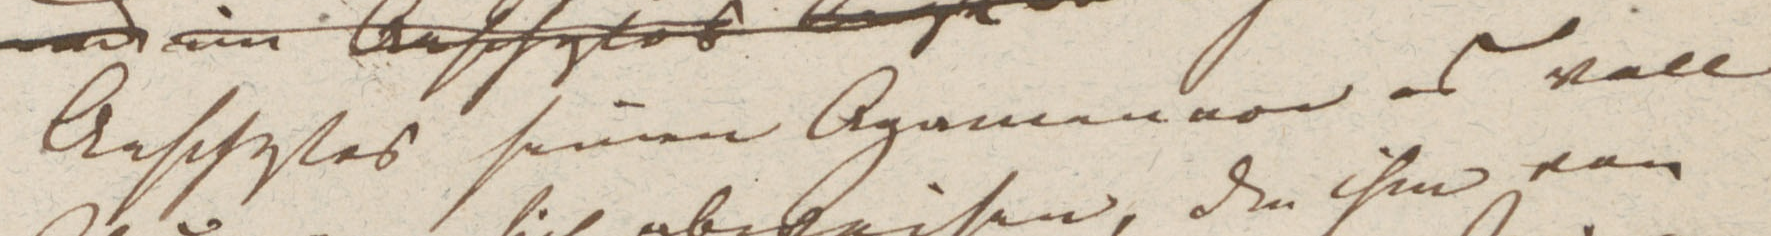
Aeschyls seinen Agamenon es voll
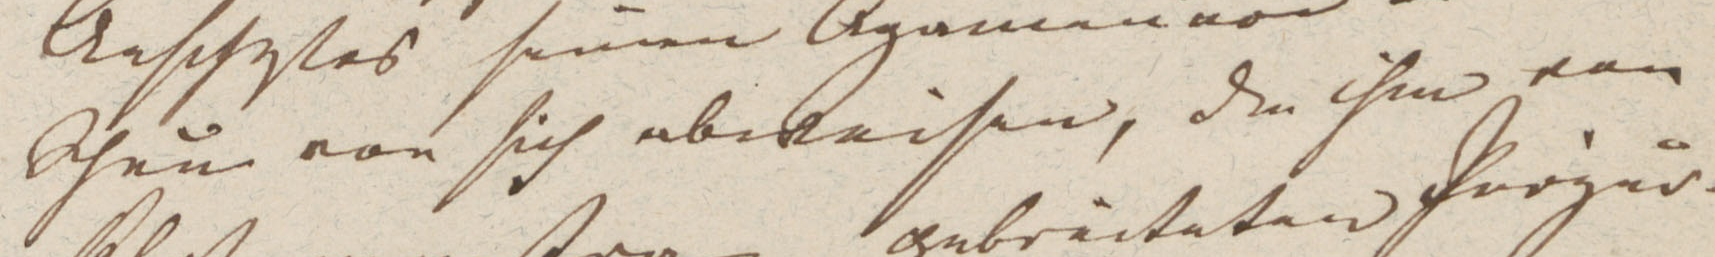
Scheu von sich abweisen, die ihm von
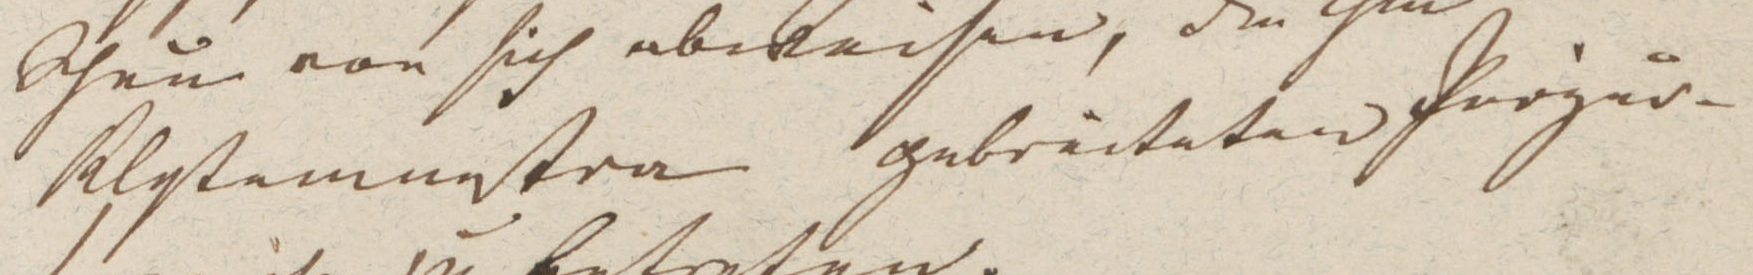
Klytamnestra gebreiteten Purpur-
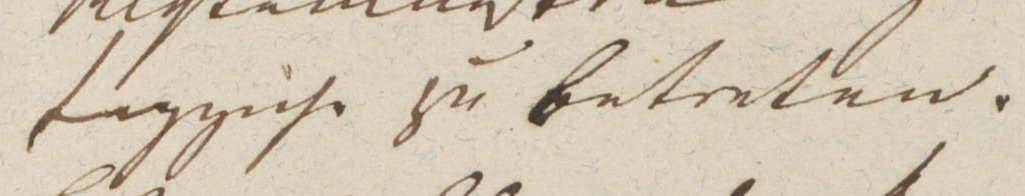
teppiche zu betreten.
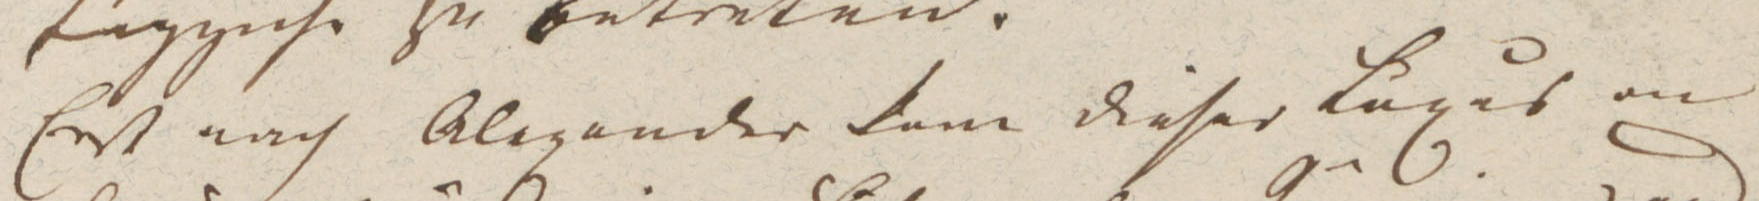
Erst nach Alexander kam dieser Luxus an
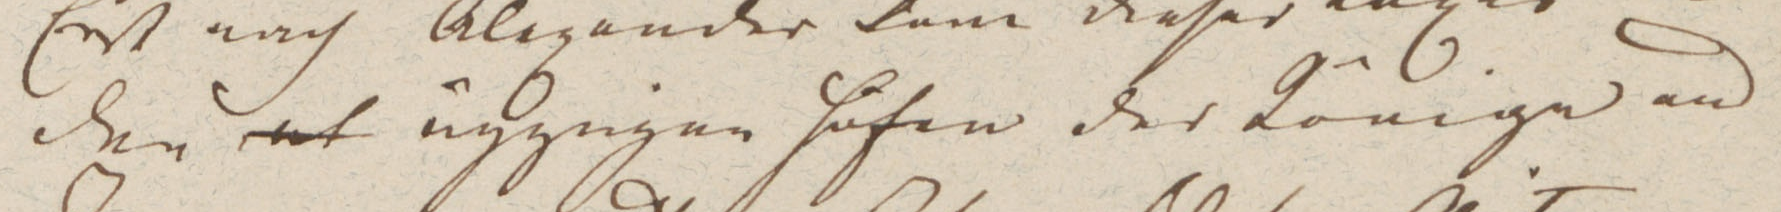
den üppigen Höfen der Könige und
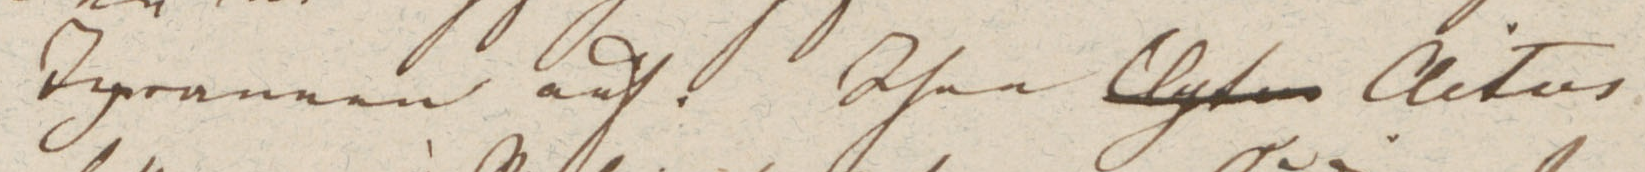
Tyrannen auf. Schon Clyt Clitus
